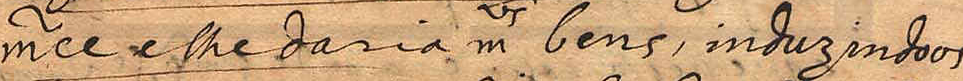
m̄ce e lhe daria mtos bens, induzindoos
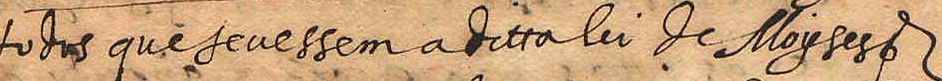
todos que teuessem a ditta lei de Moyses pr
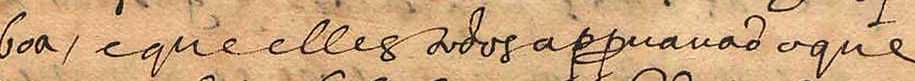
boa / e que elles todos apꝓuauaõ o que
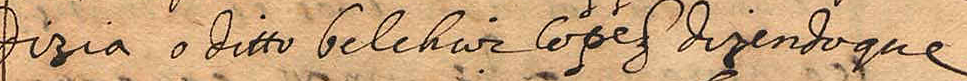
dizia o ditto belchior lopez̄ dizendo que
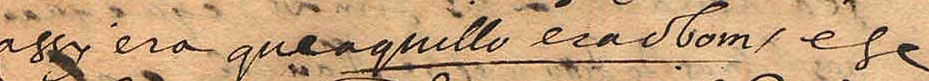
assy era que aquillo era o bom / e se
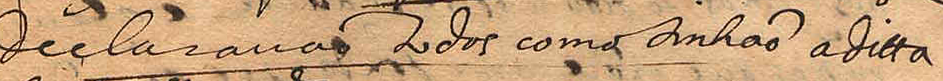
declarauaõ todos como tinhaõ a ditta
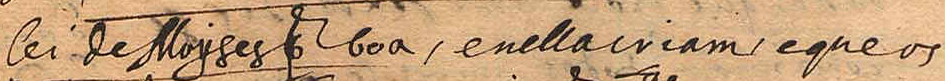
lei de Moyses pr boa / e nella criam / e que os
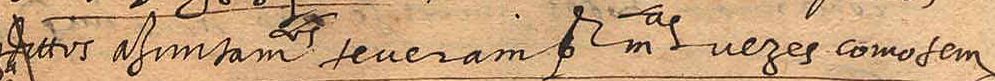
dittos aJuntamtos teueram pr mtas vezes como tem
